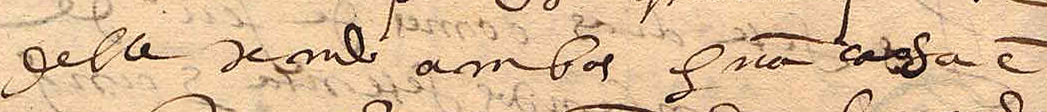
delle tendo ambos huā casa ē
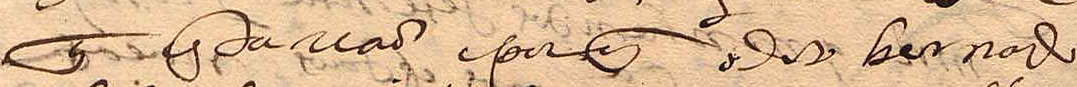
q̄ estauão e porq̄ o dito bernardo
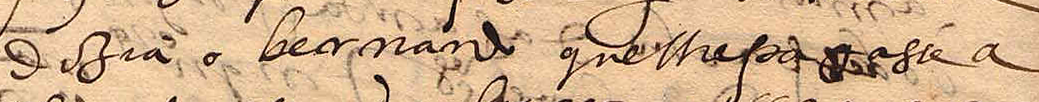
dizia o bernardo que lhe pagasse a
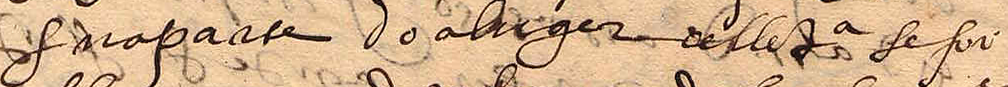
sua parte do aluger e elle ta se foi
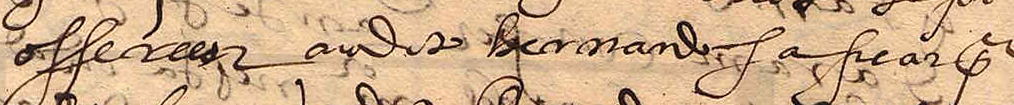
offerecer ao dito Bernardo ꝑa ficar por
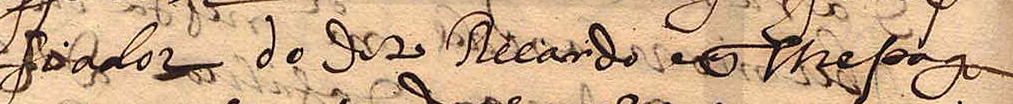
fiador do dito Recardo e q̄ lhe paga
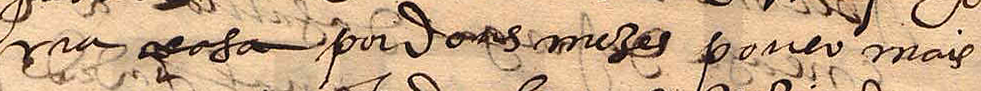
ria a casa por dous mezes pouco mais
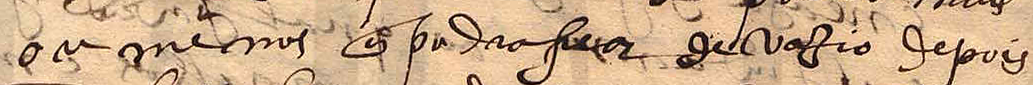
ou menos q̄ podia ficar de vazio depois
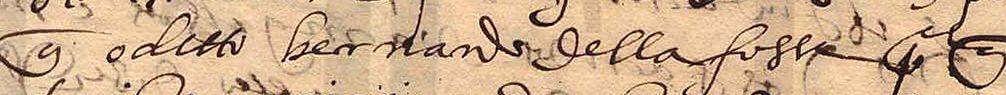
q̄ o ditto bernando della fosse porq̄
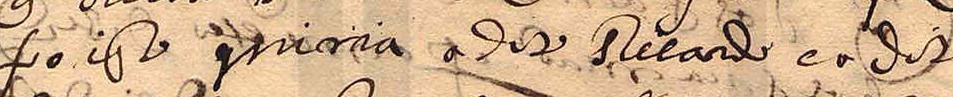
soo isto quiria o dito Ricardo e o dito
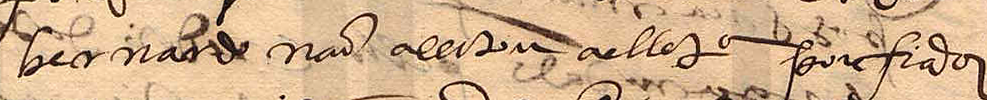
bernardo naõ aceitou a elle ta por fiador
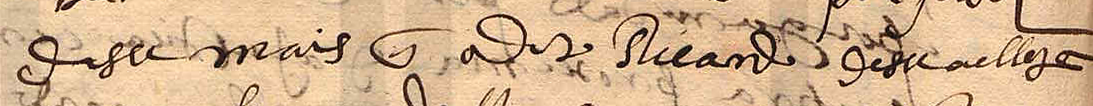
e disse mais q̄ o dito Recardo disse a elle ta
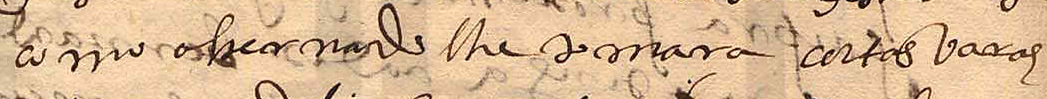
como o bernardo lhe tomara certas varas
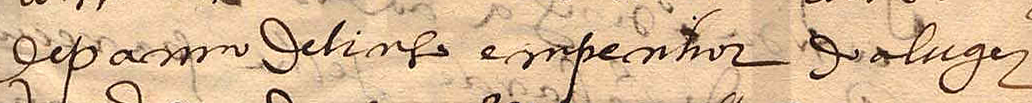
de panno de linho em penhor do aluger
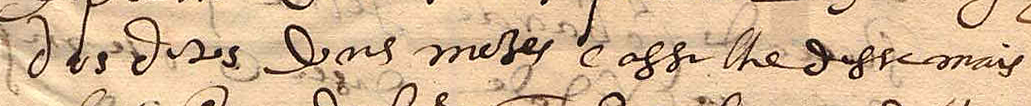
dos ditos dous mezes e assi lhe disse mais
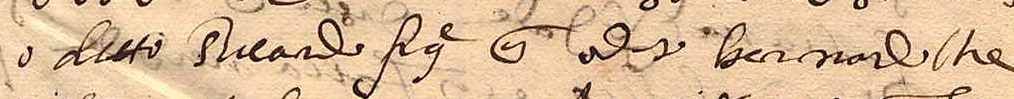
o ditto Ricardo fiqe q̄ o dito bernado lhe
